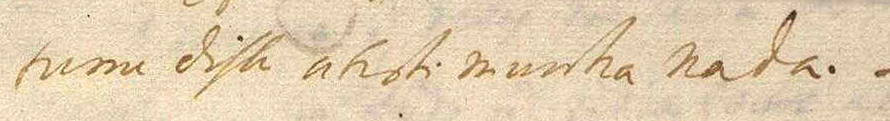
tume disse a testemunha nada.
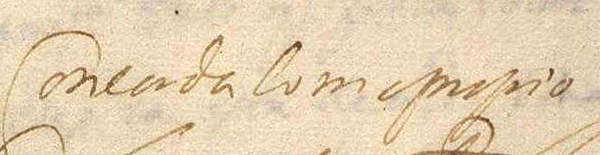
Concorda Com o propio
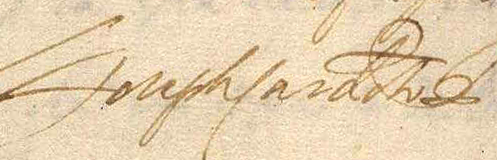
Jozeph Cardoso
